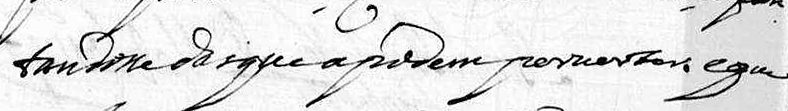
tandosse das que a podem peruerter e que
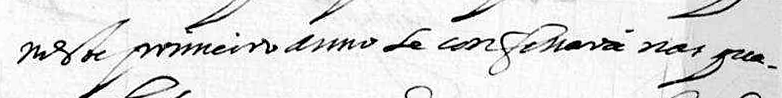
neste primeiro anno se confessava nas qua
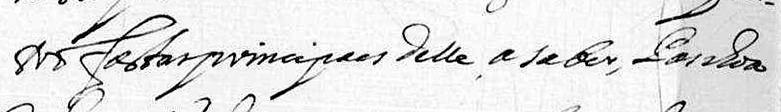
tro festas principaes delle a saber, Paschoa
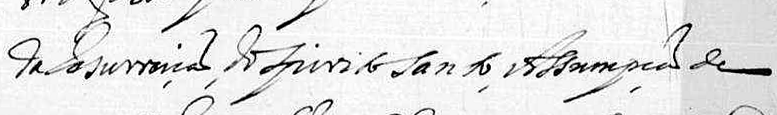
da Resurreiçaõ, do Spirito Santo, Assumpçaõ de
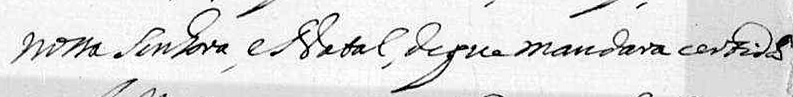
nossa Senhora, e Natal, de que mandara certidaõ
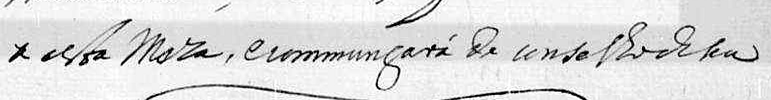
a esta Meza, e commungará de conselho de seu
